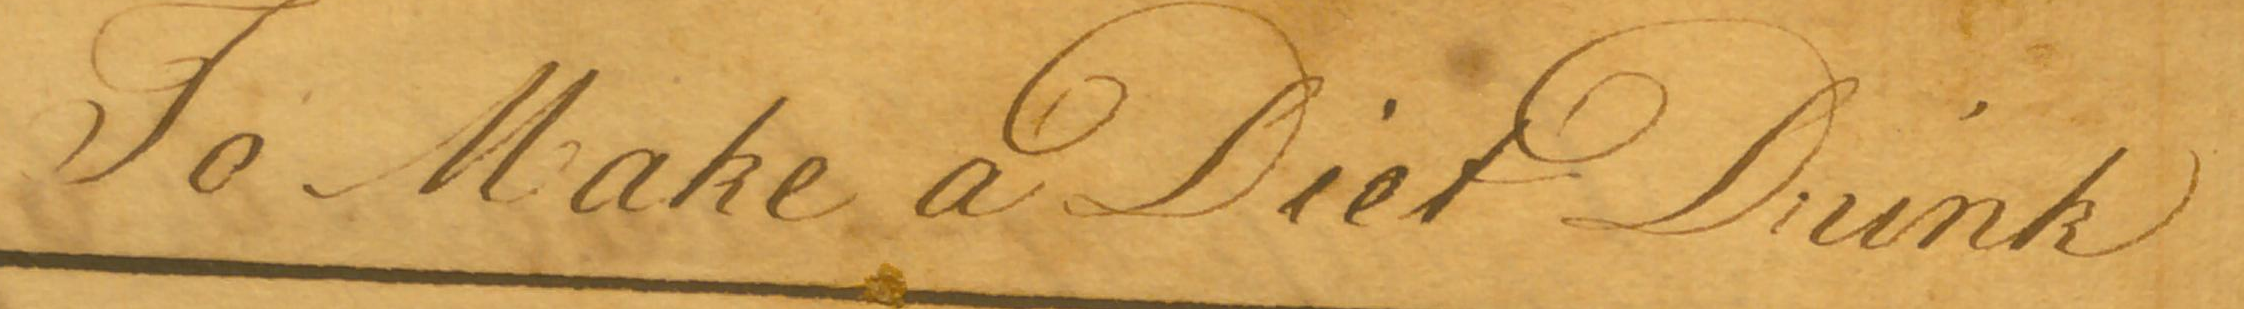To Make a Diet Drink
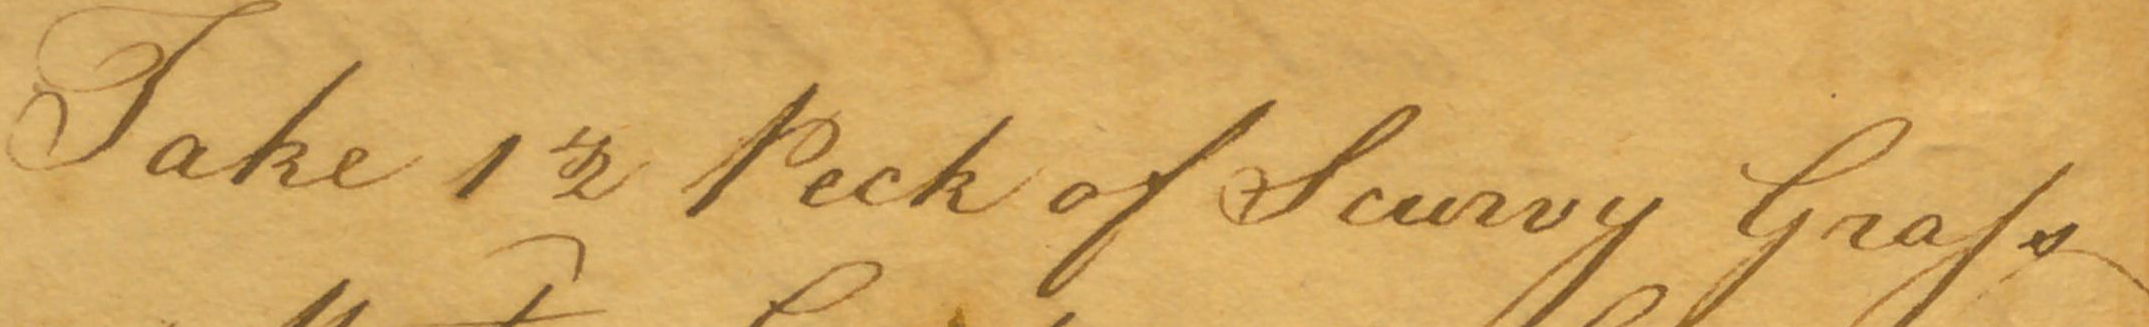Take 1 1/2 peck of Scurvy Grass
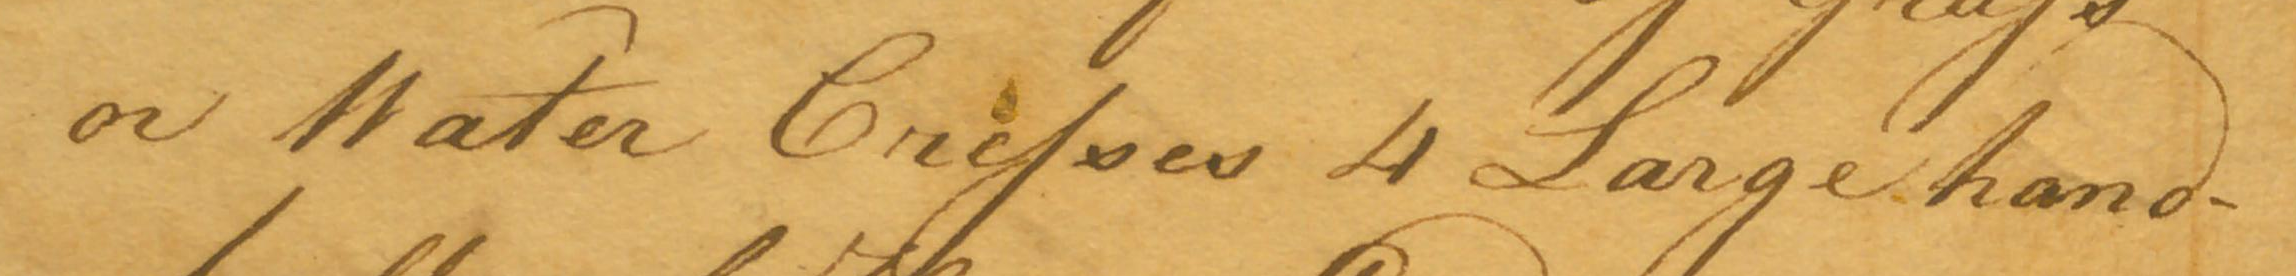or Water Cresses 4 Large hand-
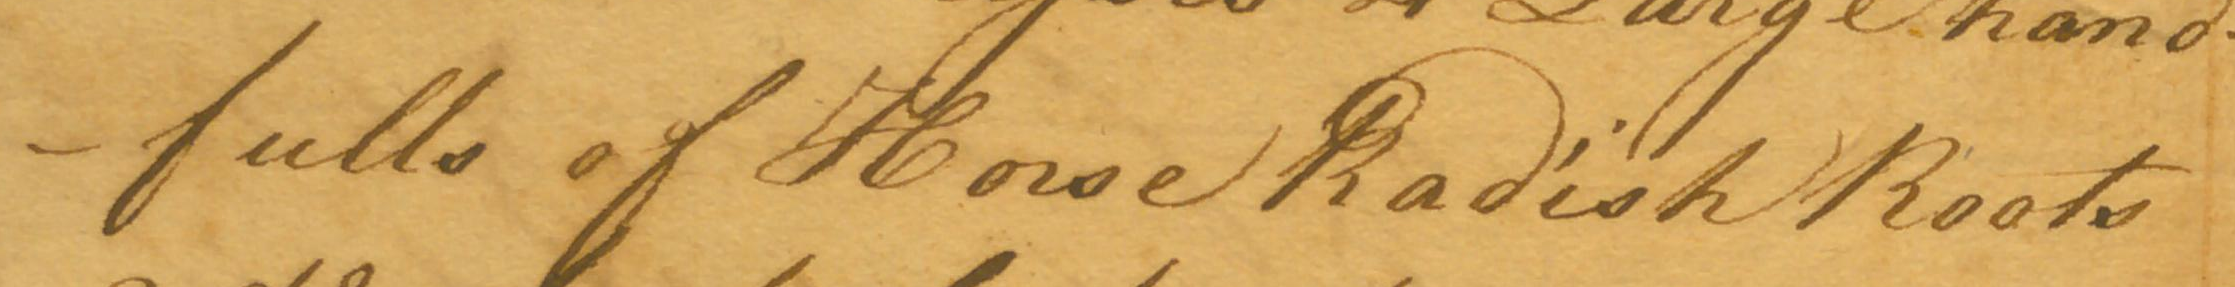-fulls of Horse Radish Roots
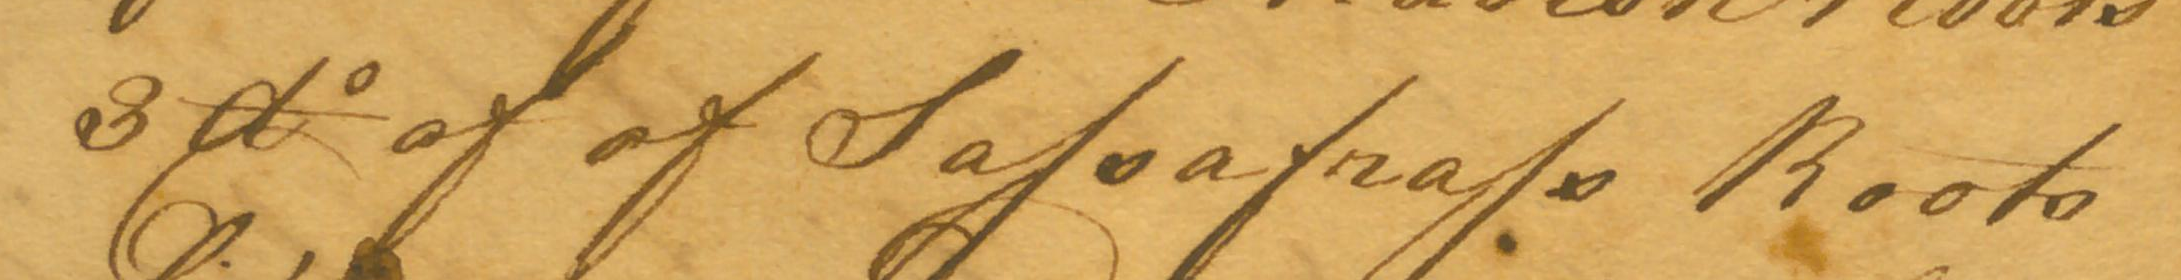3 d^o of of Sassafrass Roots
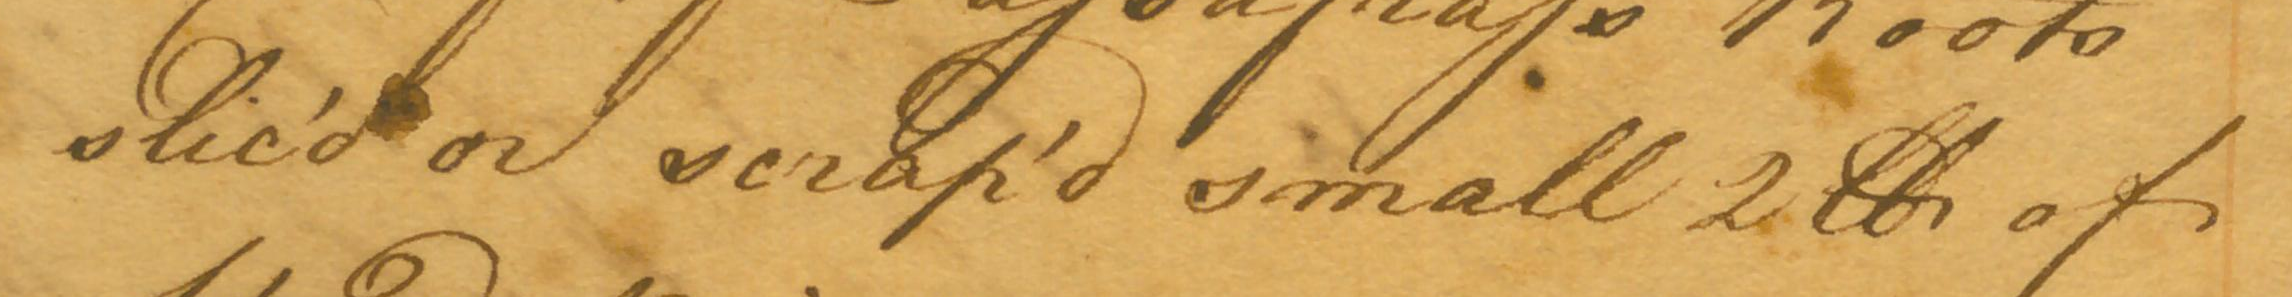slic'd or scrap'd small 2 lb of
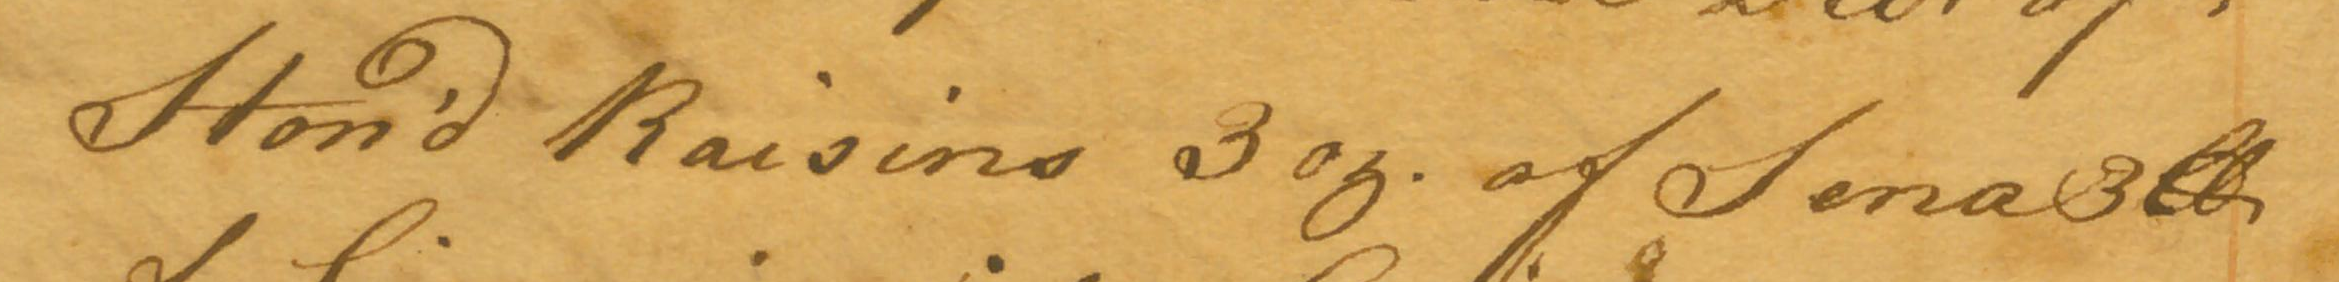Ston'd Raisins 3 oz. of Sena 3 lb
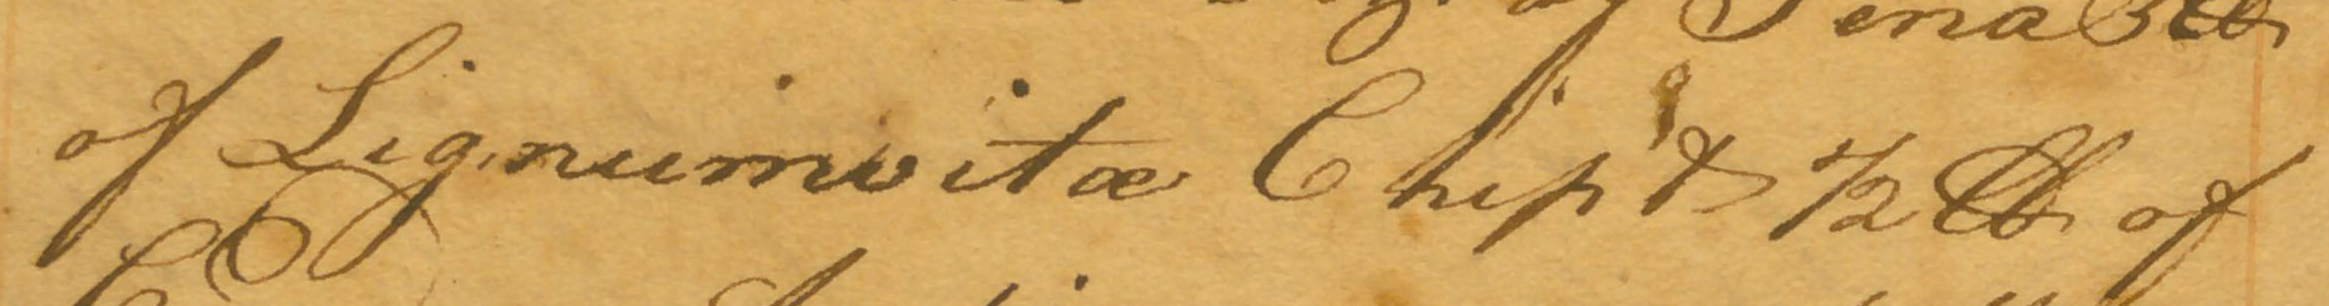of Lignumvitae Chip & 1/2 lb of
